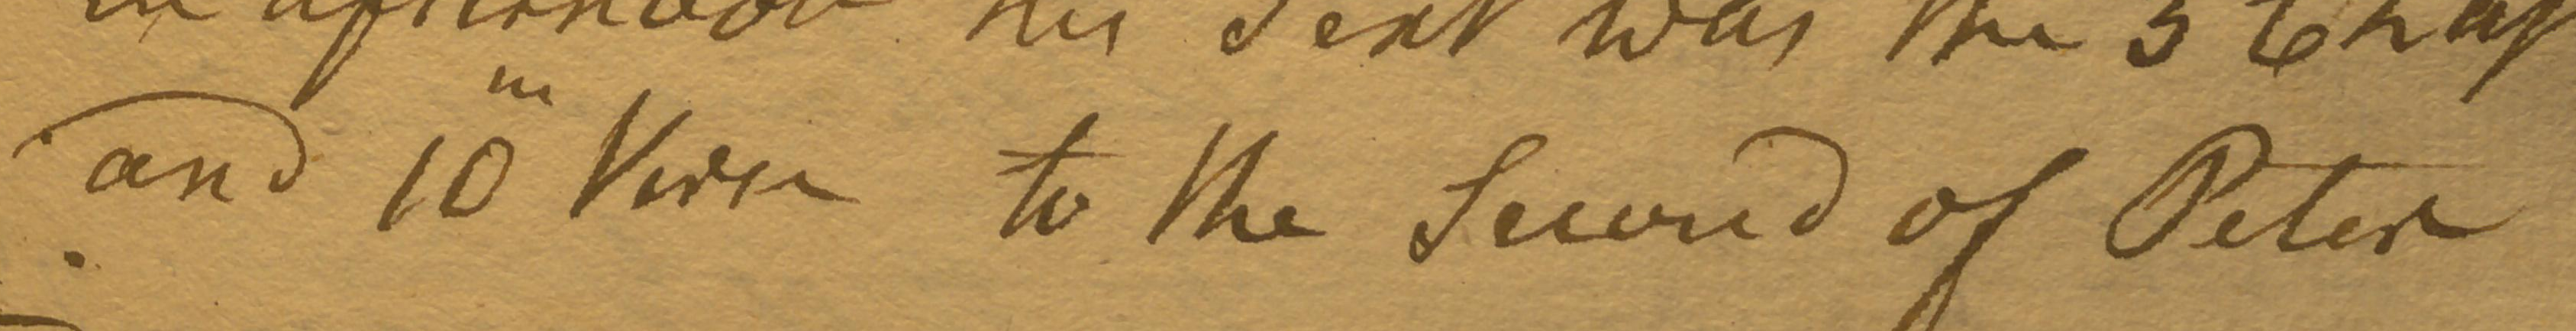and 10^th Verse to the second of Peter
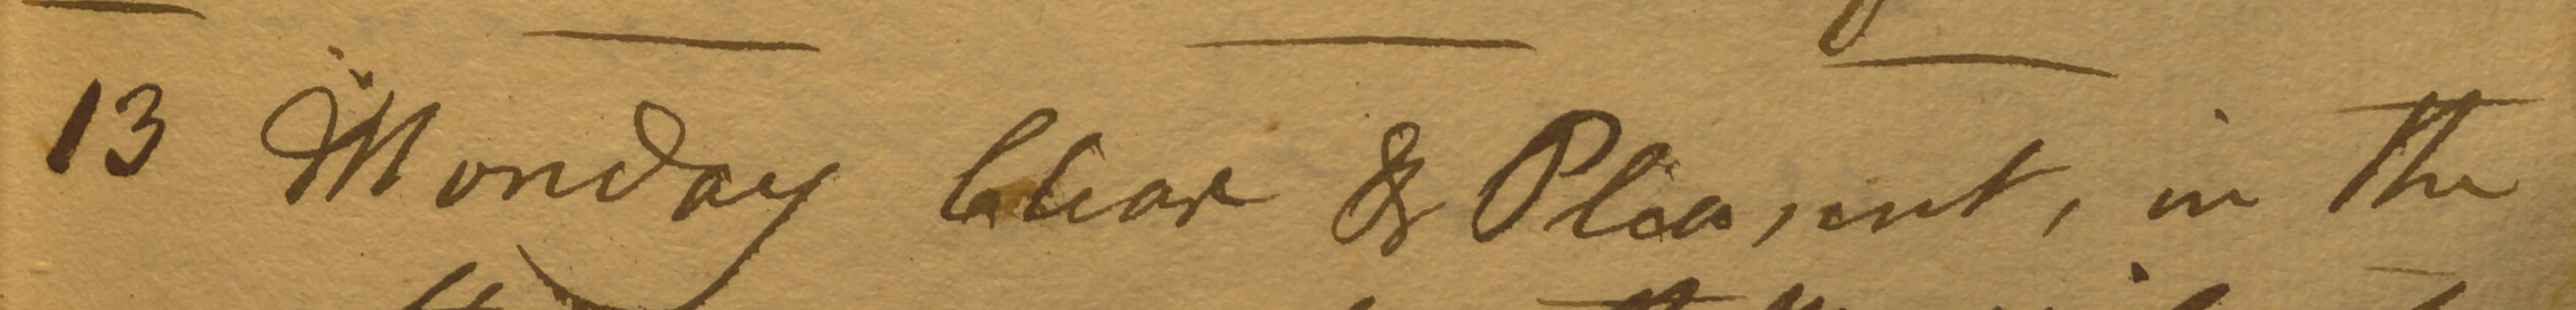13 Monday Clear & Pleasent, in the
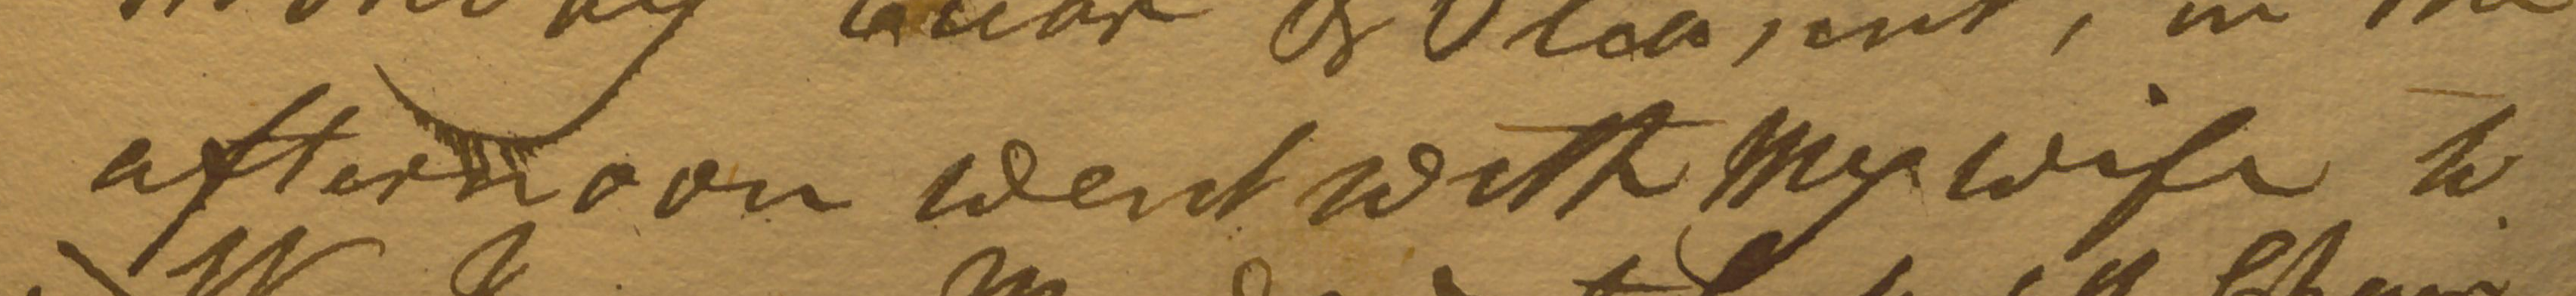afternoon went with My wife to
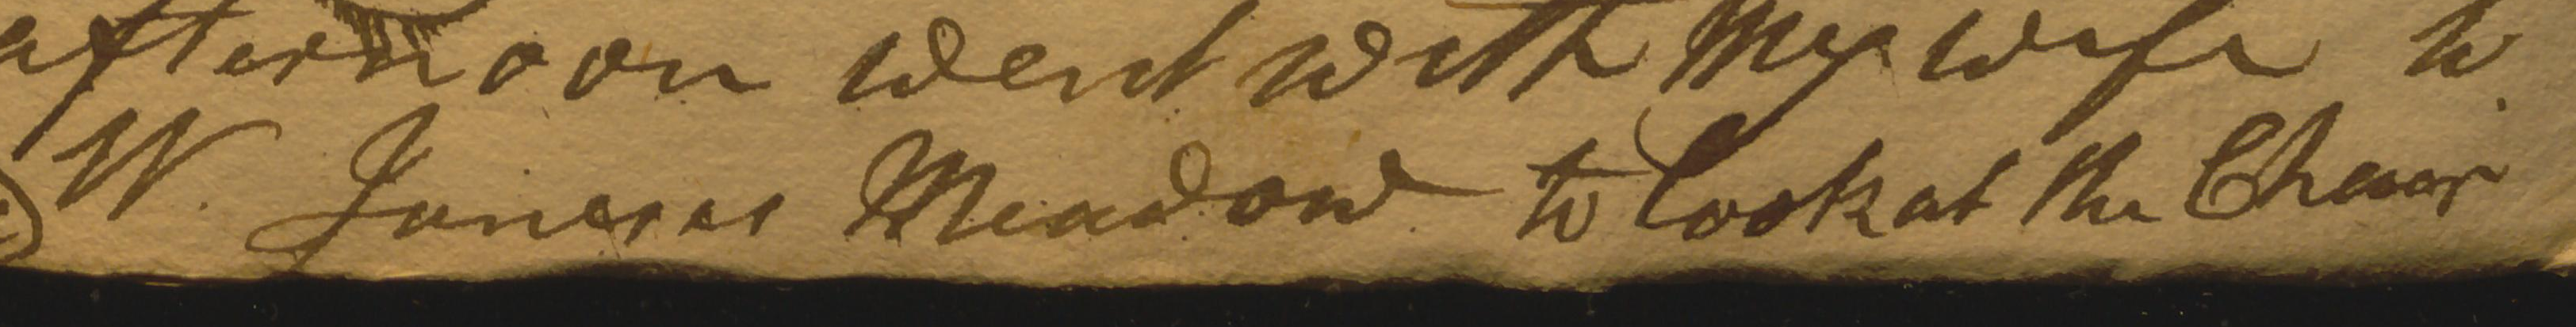W. Joneses Meadow to look at the Chair
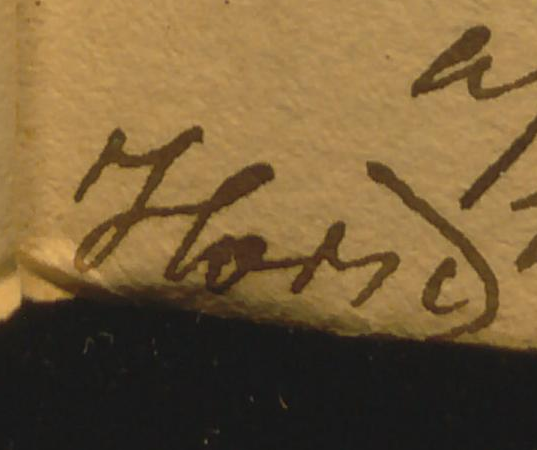Horse
